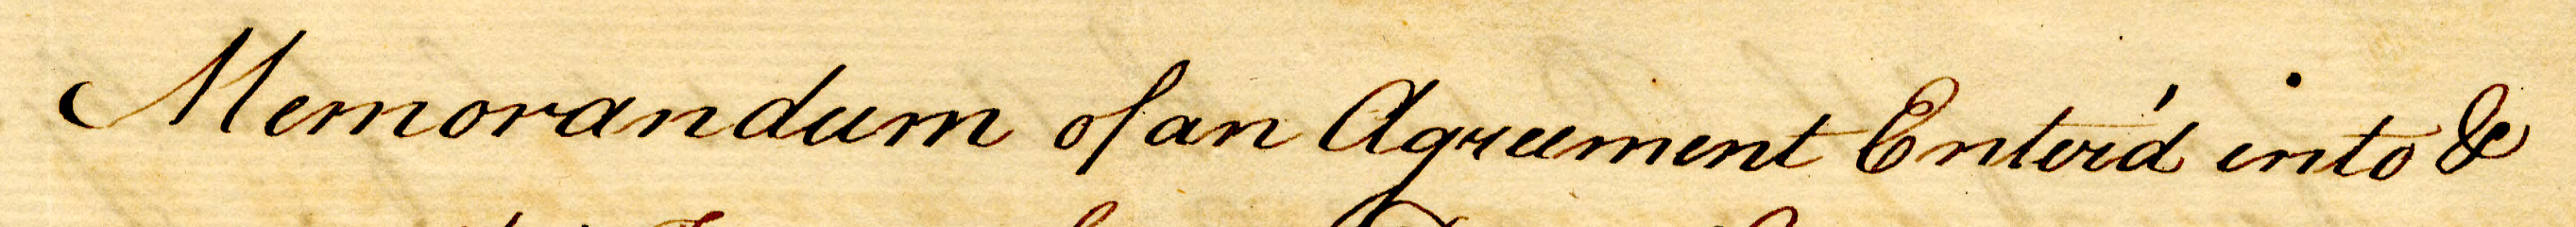Memorandum of an agreement Enter'd into &
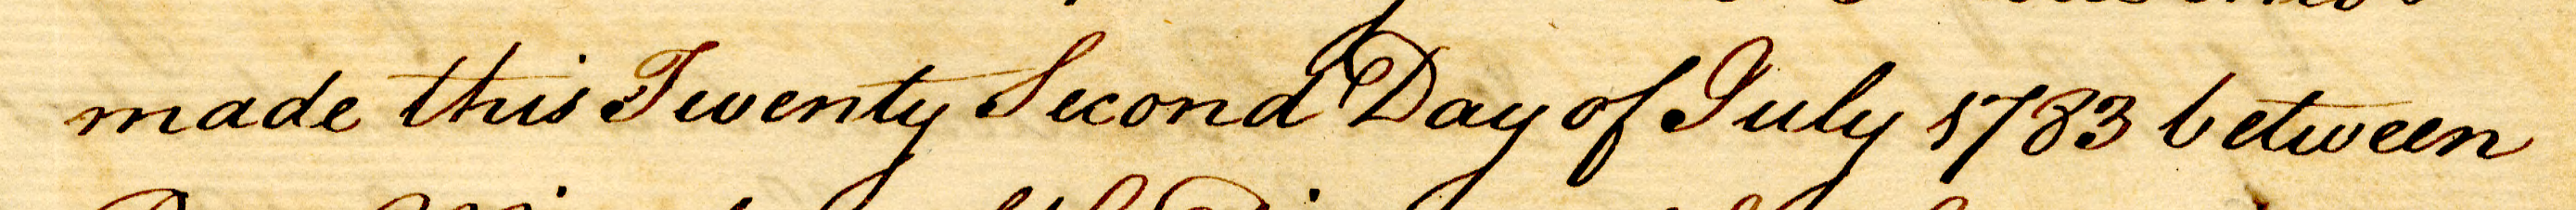made this Twenty Second Day of July 1783 between
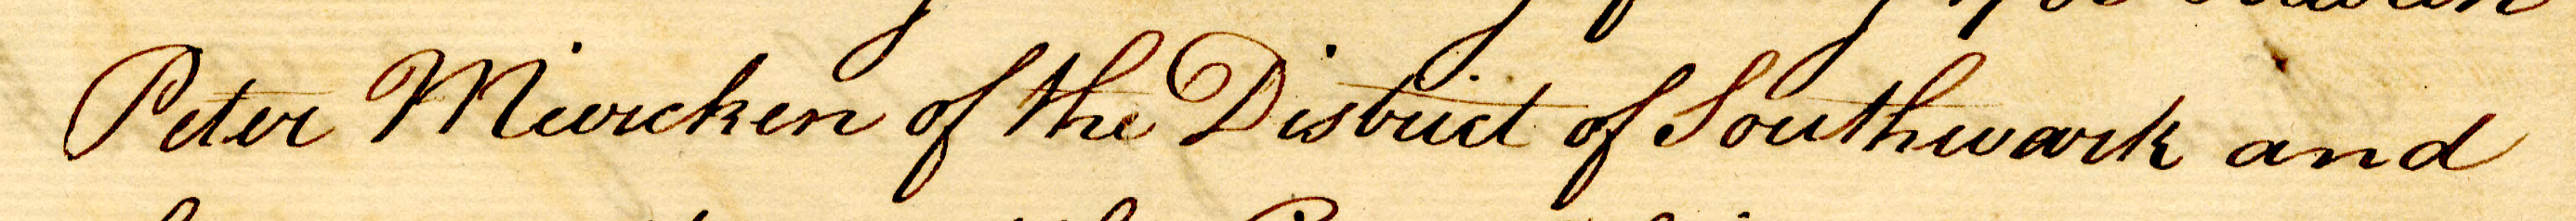Peter Miercken of the District of Southwark and
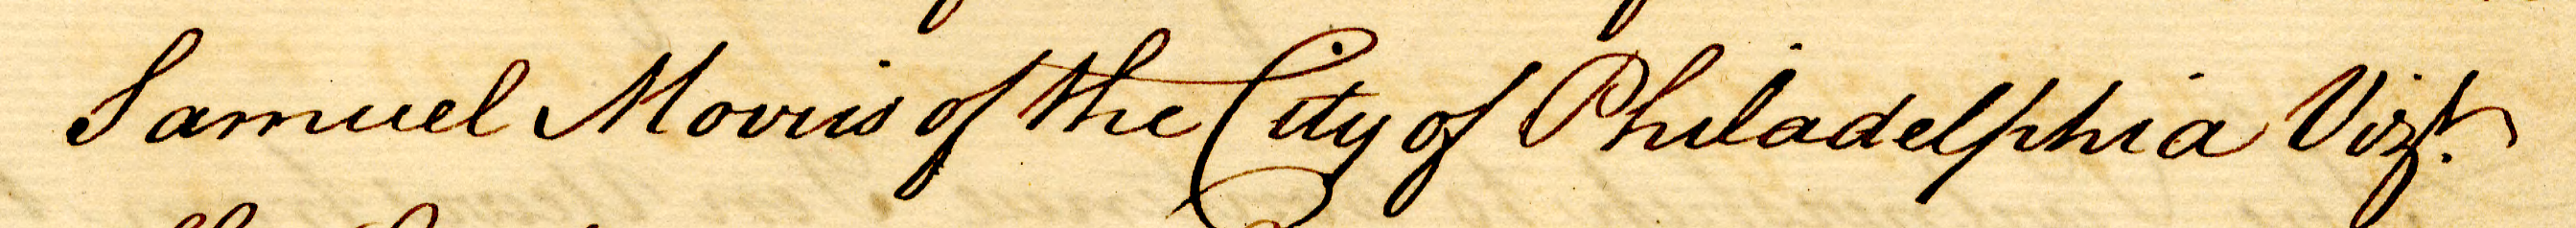Samuel Morris of the City of Philadelphia Viz^t.
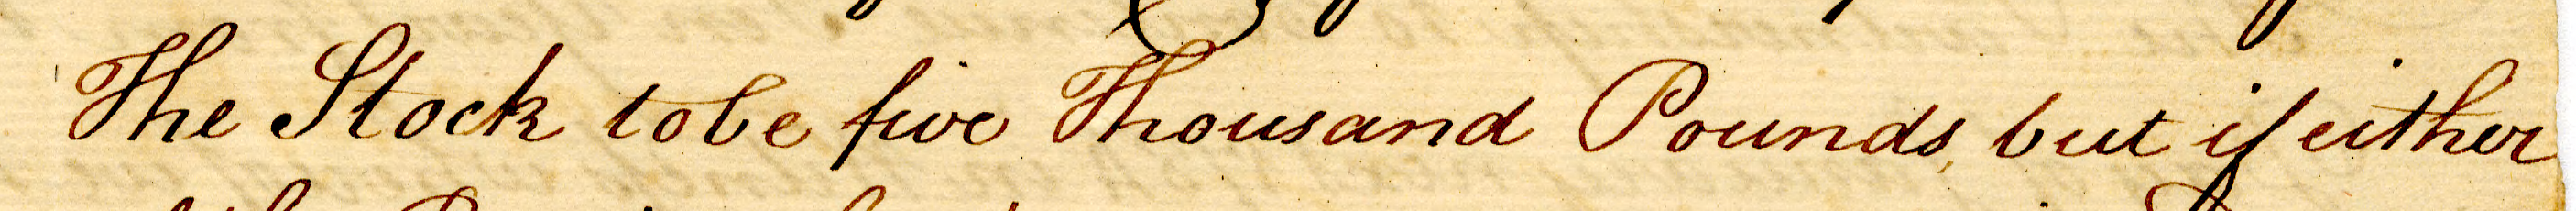The Stock to be five Thousand Pounds but if either
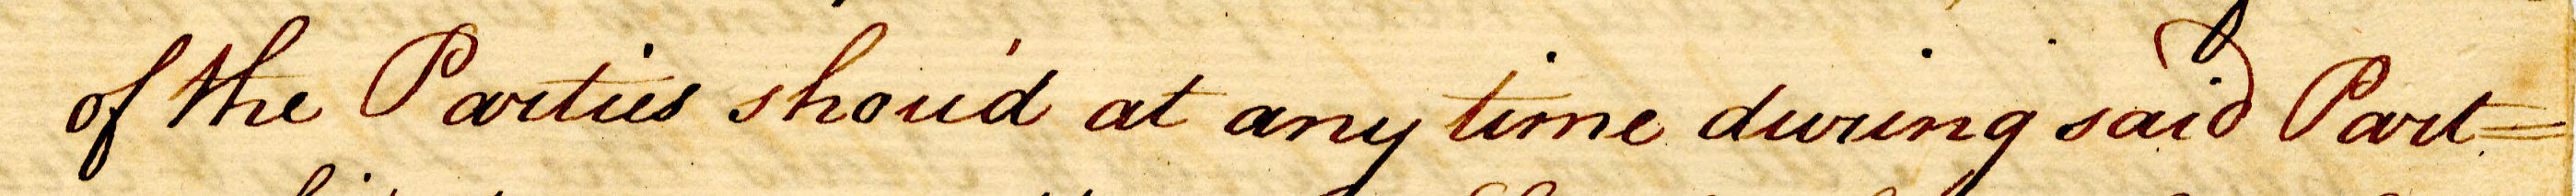the Parties shou'd at any time during said Part-
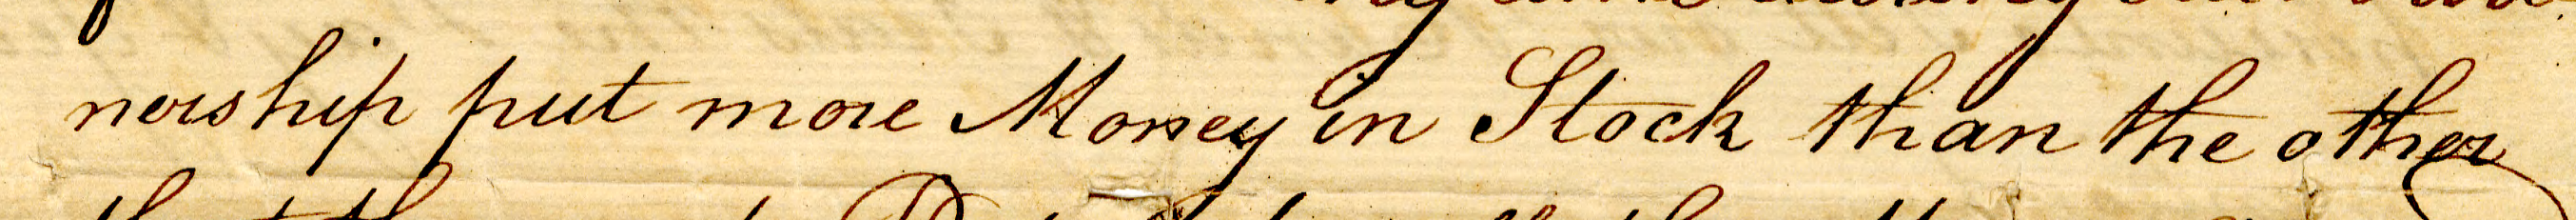nership put more Money in Stock than the other
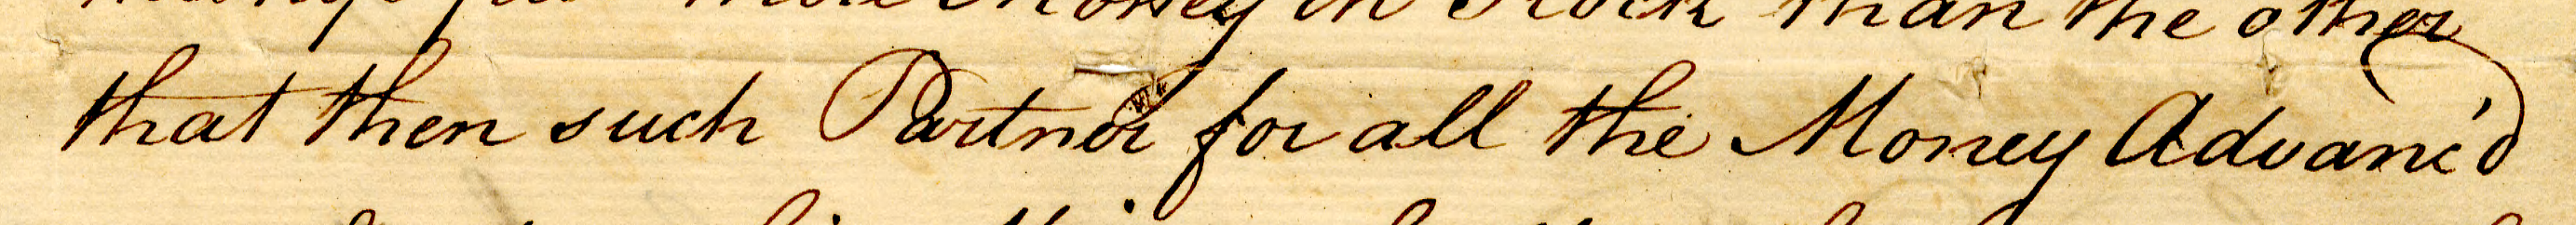that then such Partner for all the Money Adavnc'd
